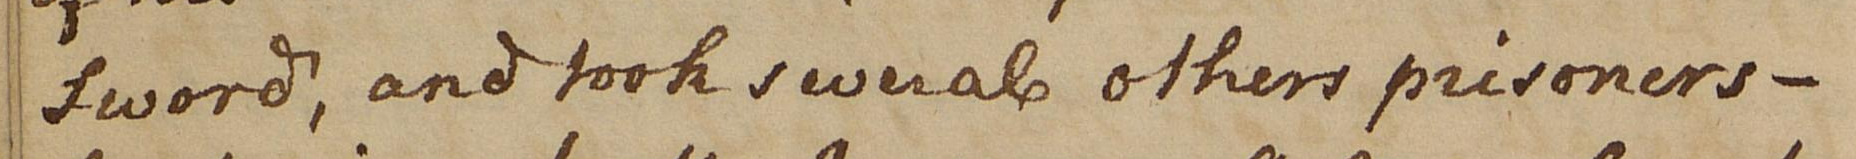Sword, and took several others prisoners-
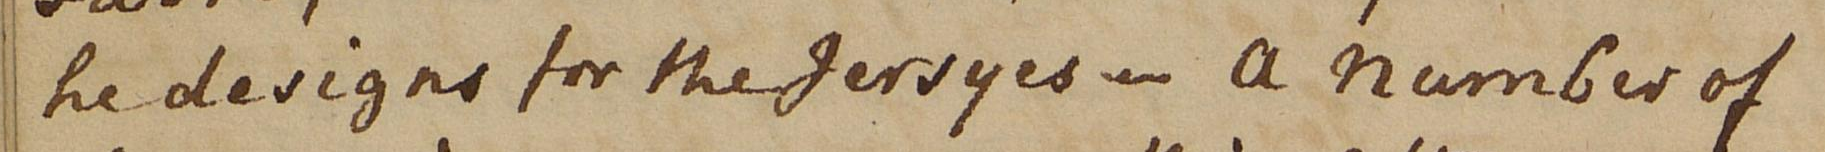he designs for the Jersyes- A number of
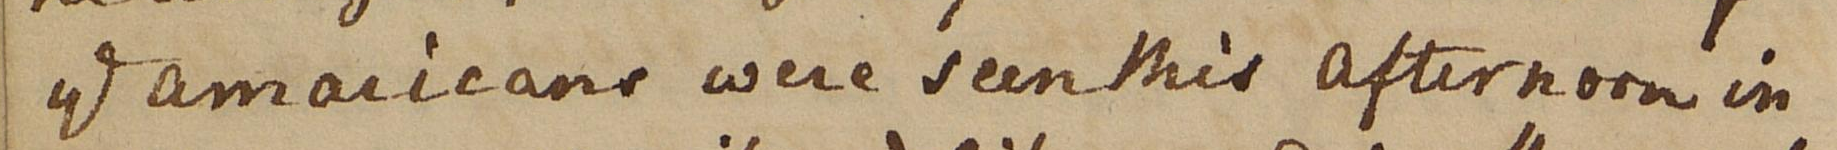y^e Amaricans were seen this Afternoon in
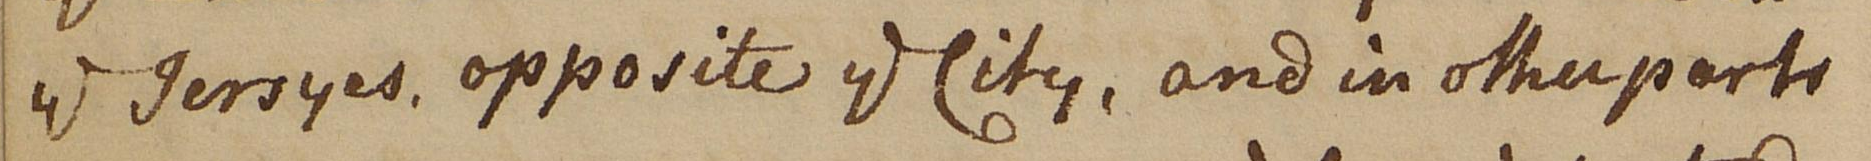y^e Jersyes, opposite y^e City, and in other parts
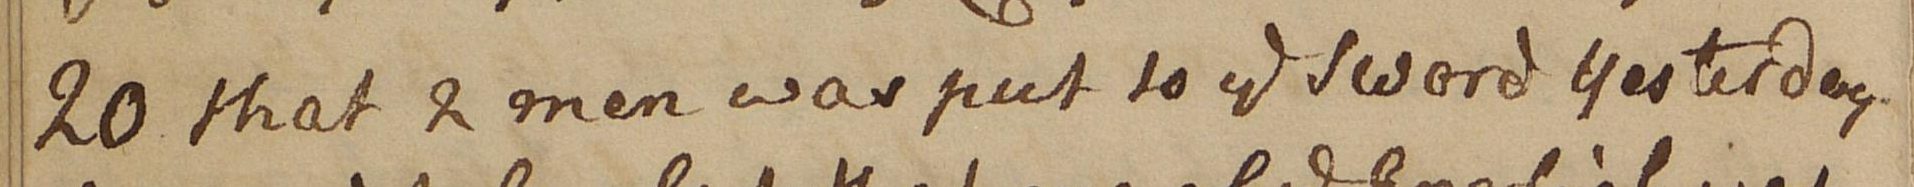20 that 2 men was put to y^e Sword Yesterday
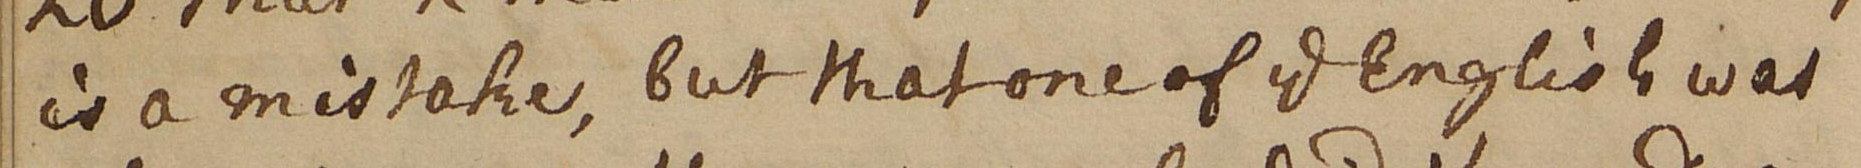is a mistake, but that one of y^e English was
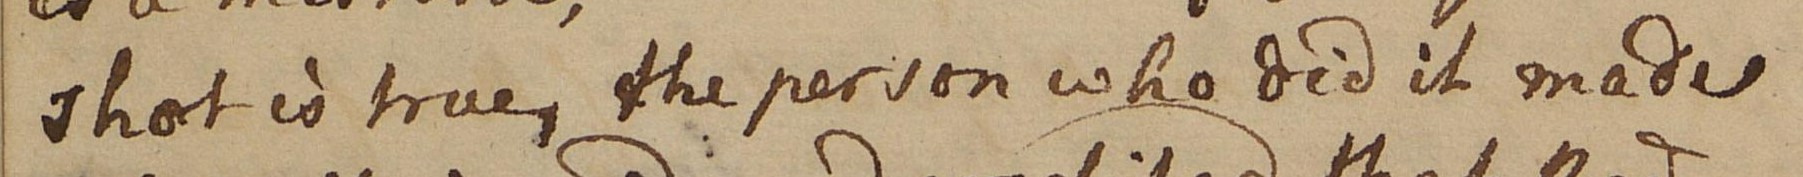shot is true, the person who did it made
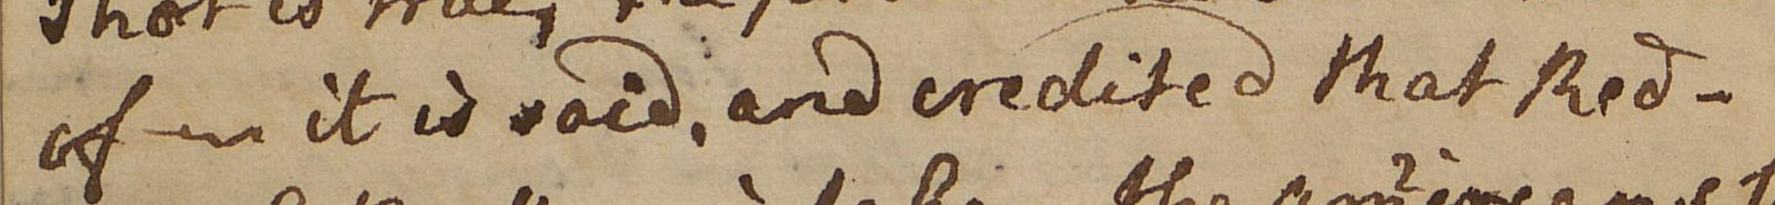of - it is said, and credited that Red-
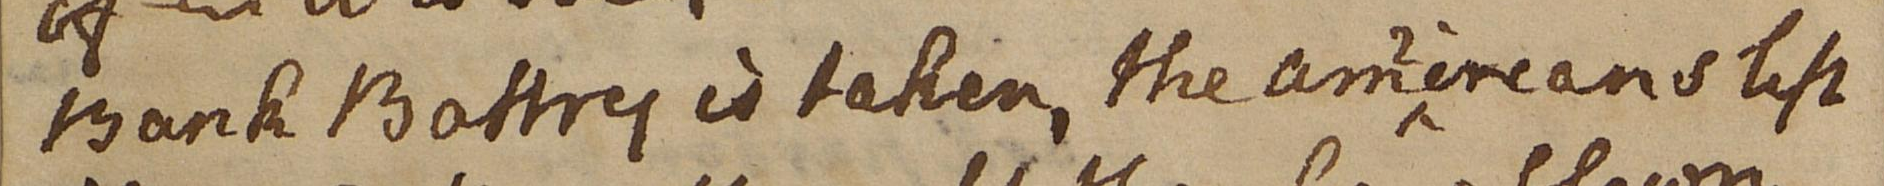Bank Battry is taken, the Am^r ircans left
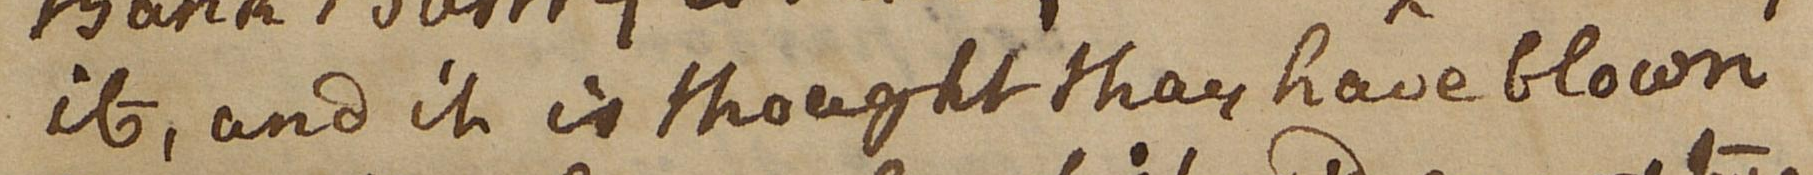it, and it is thought thay have blown
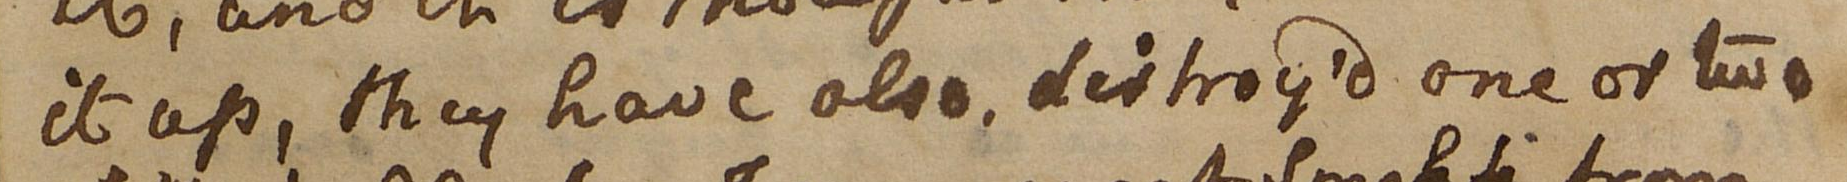it up, they have also, destroy'd one or two
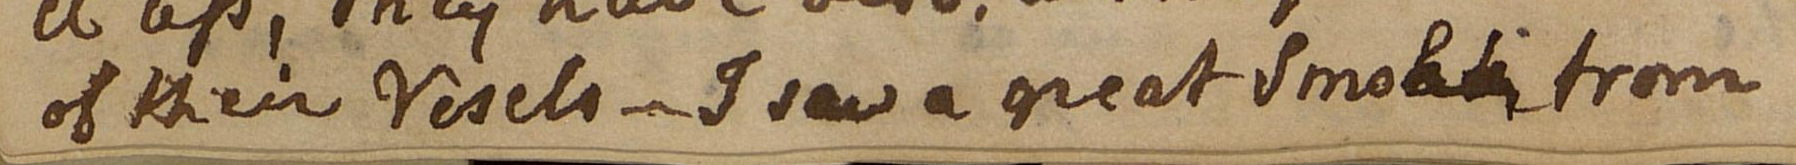of their Vesels- I saw a great Smokk from
